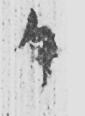千
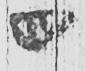四
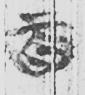百
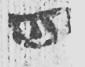四
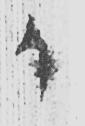千
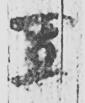五
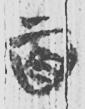百
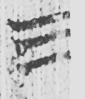三
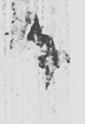千
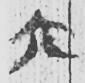六
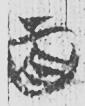百
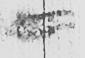二
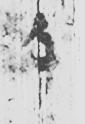千
